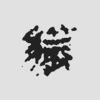綠
